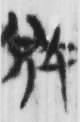敓
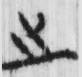之
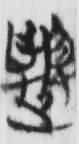○（舉）
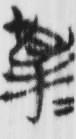牛犆
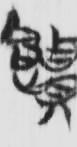饋
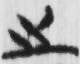之
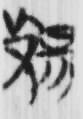殤
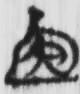因
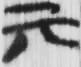亓（其）
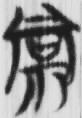常
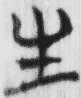生（牲）
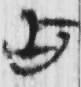占
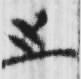之
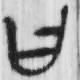曰
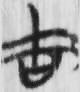吉
